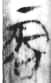丙
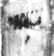丁
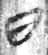日
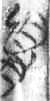○（擾）
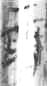帝
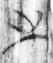之
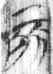所
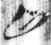㠯（以）
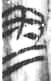翏（戮）
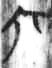六
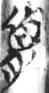○（擾）
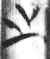之
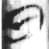日
